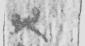五
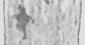十
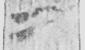二
